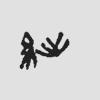絀
